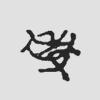事
